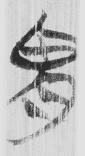胃
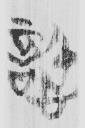{言千心}
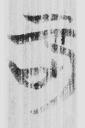可
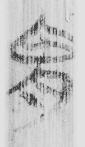胃
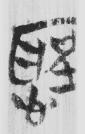{耳呈心}
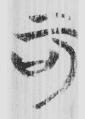可
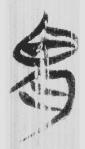胃
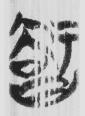智
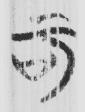可
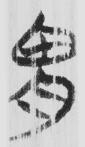胃
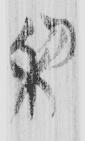利
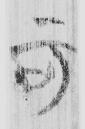可
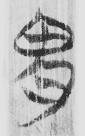胃
